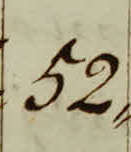52
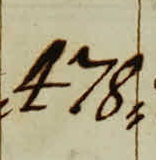478
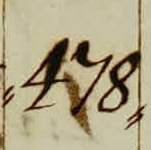478
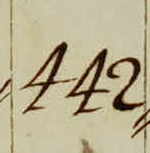442
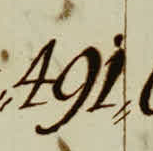491
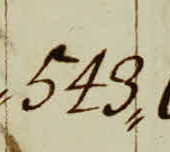543
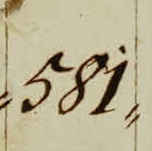581
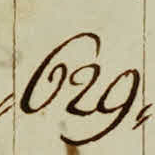629
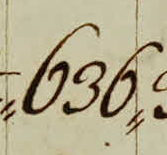636
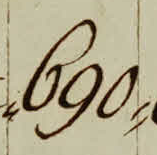690
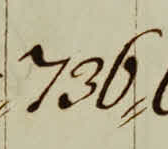736
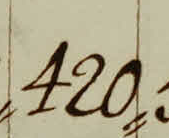420
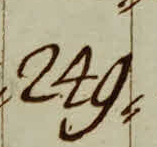249
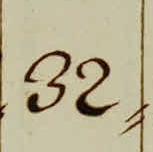32
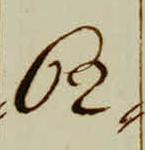62
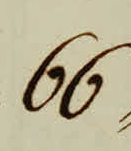66
